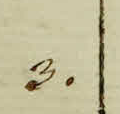3.
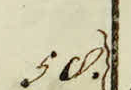58.
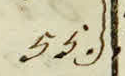55.
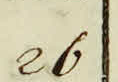26
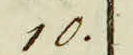10.
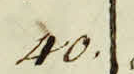40.
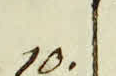10.
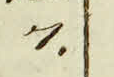7.
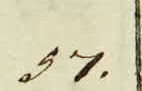57.
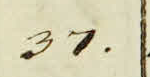37.
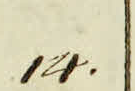14.
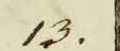13.
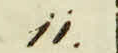11.
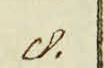8.
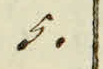5.
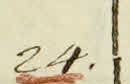24.
